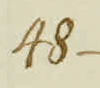48
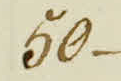50
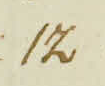12
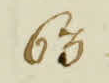63
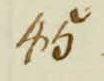45
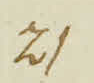21
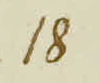18
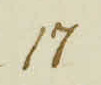17
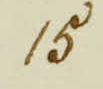15
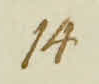14
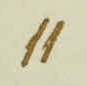11
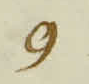9
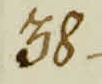38
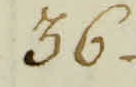36
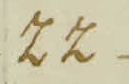22
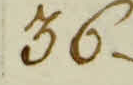36
